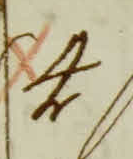4
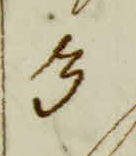3
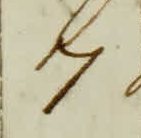7
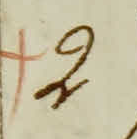2
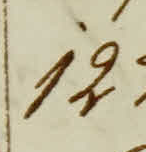12
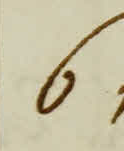6
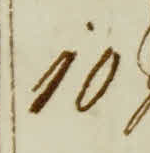10
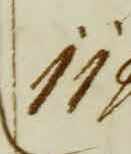11
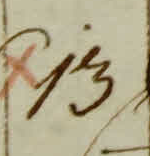13
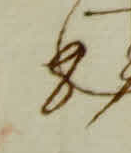8
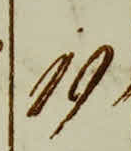19
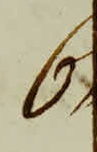6
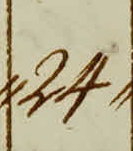24
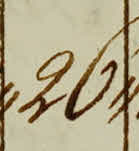26
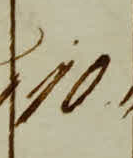10
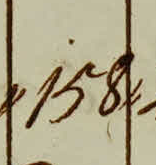158
